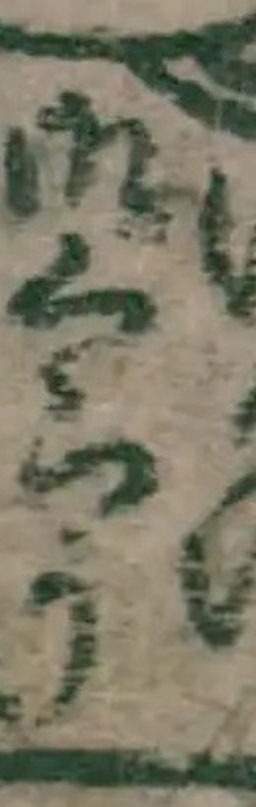御くらう
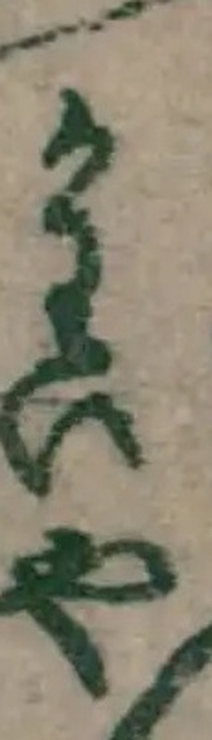かわいや
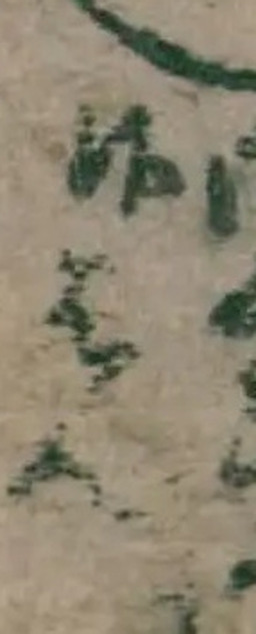候はん

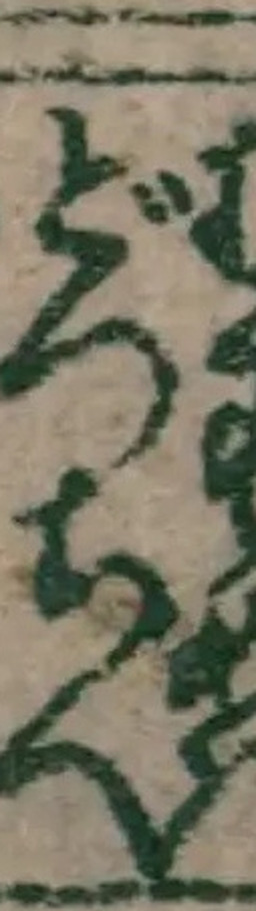どつちへ
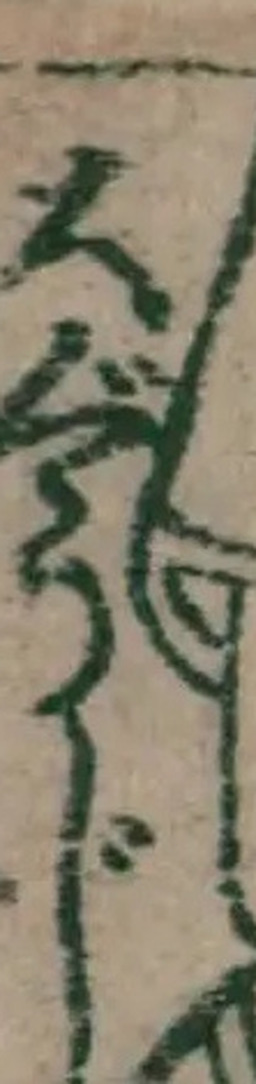大ぐうじ
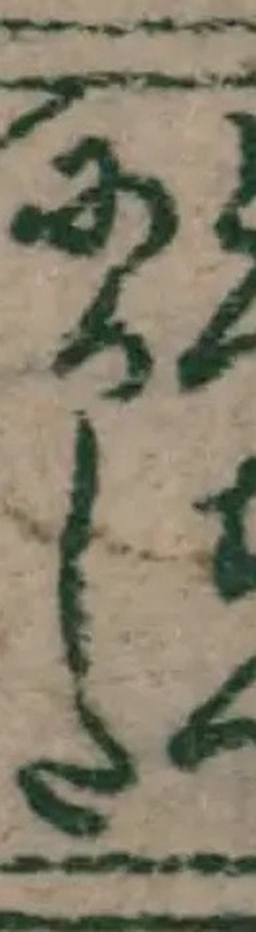にかした
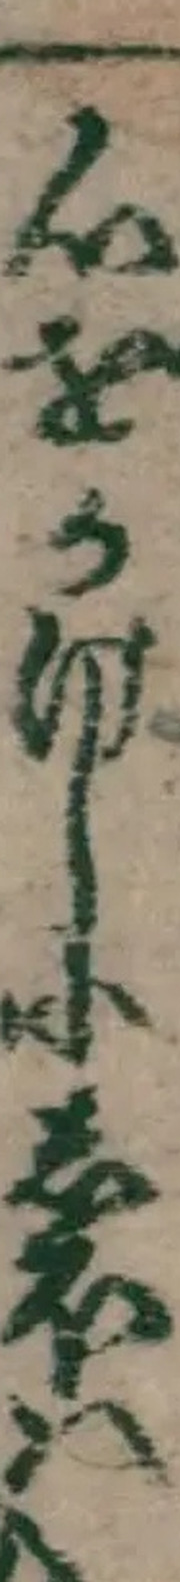心をかけし小しほは
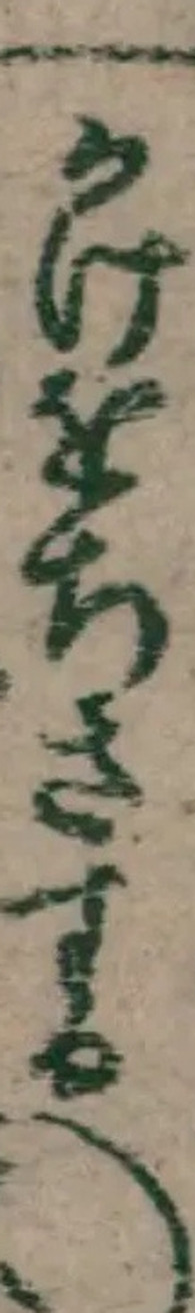かけをちさする
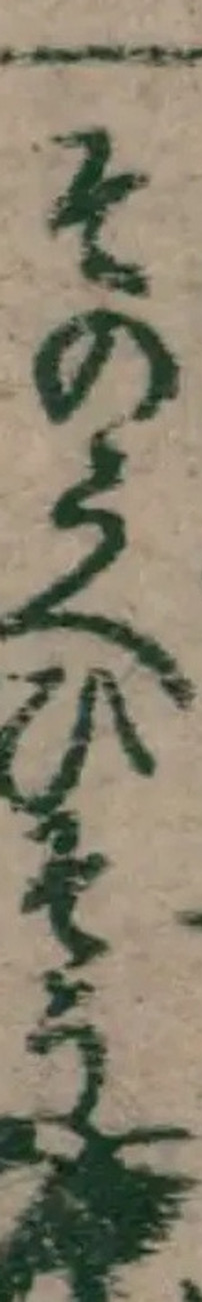そのうへひそう
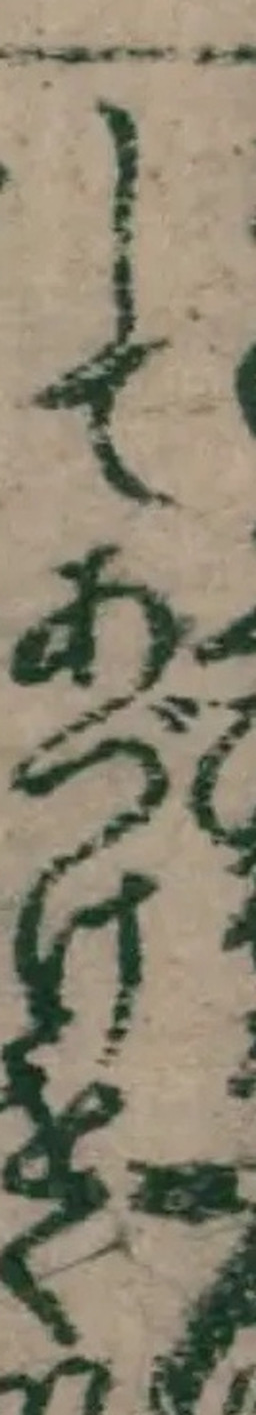してあづけをく
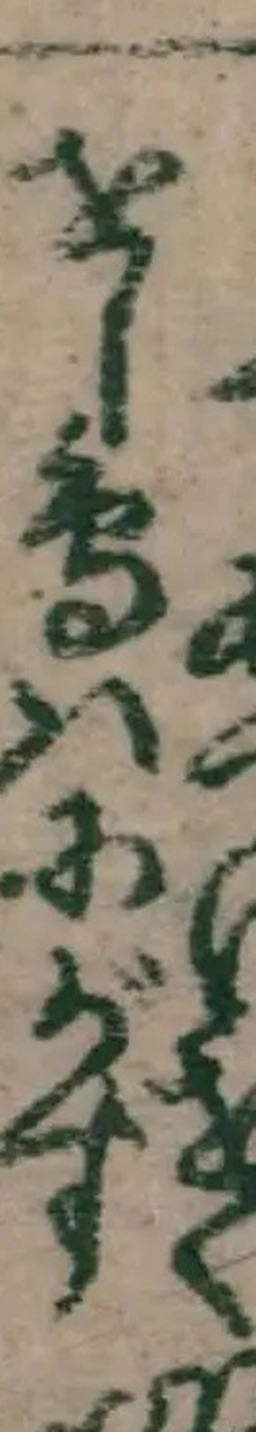をし鳥はにがす
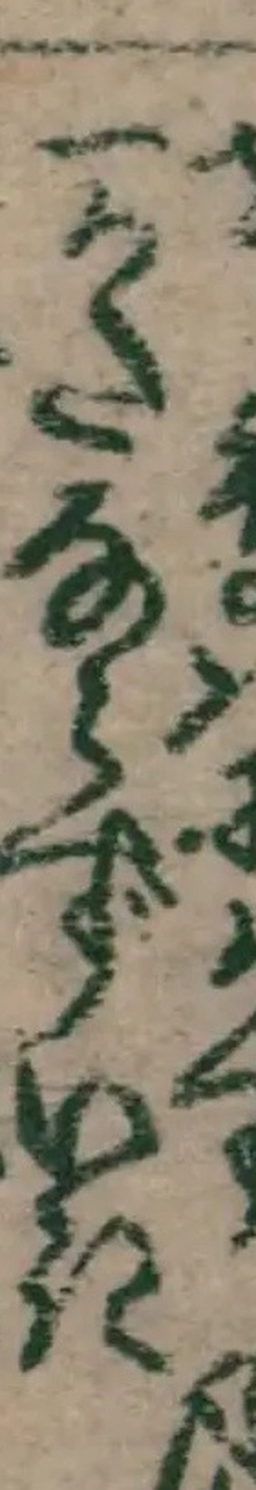一かたならずいき
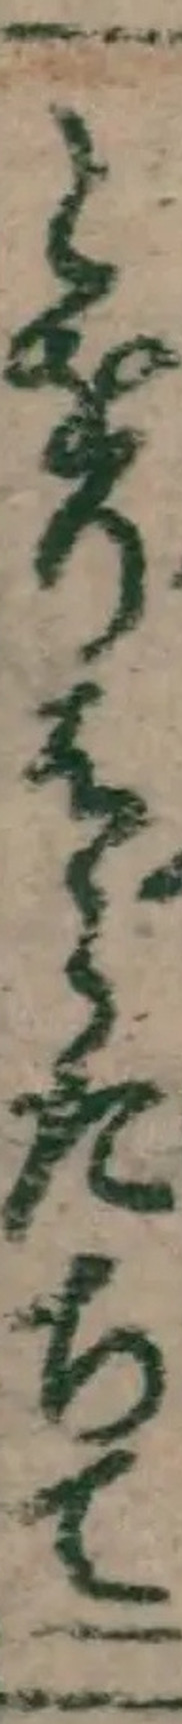とをりはらたちて
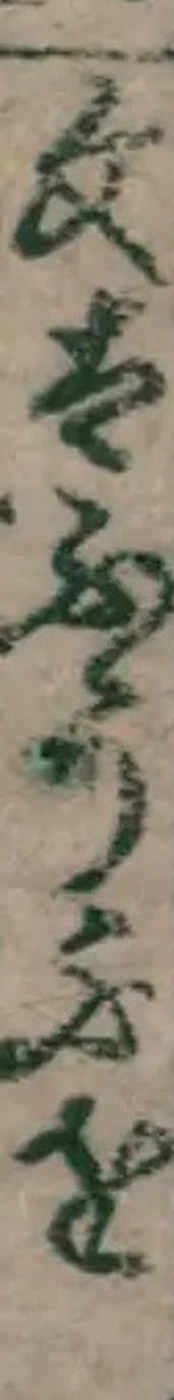文太ふうふを
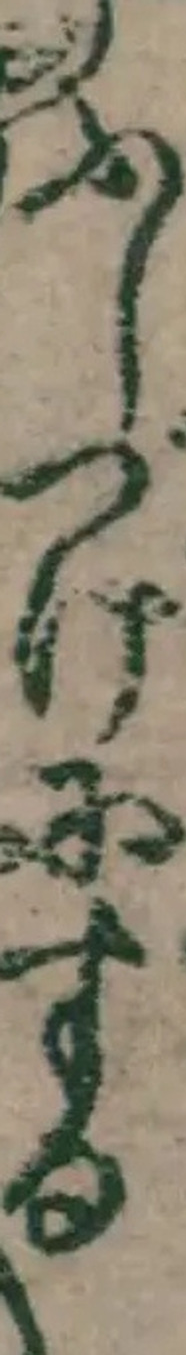ふしづけにする
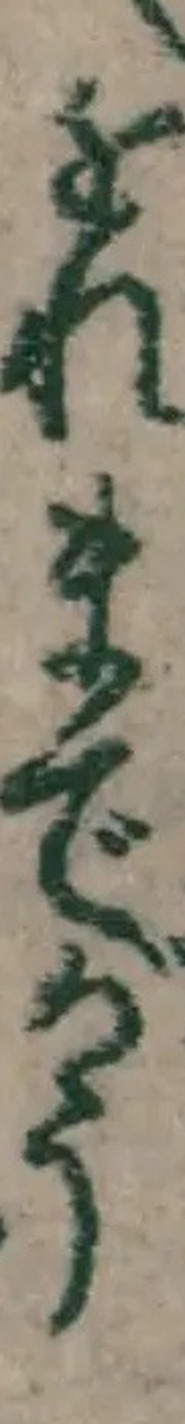をれまでがう
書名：塩売文太物語 2巻
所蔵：国立国会図書館 National Diet Library, JAPAN
